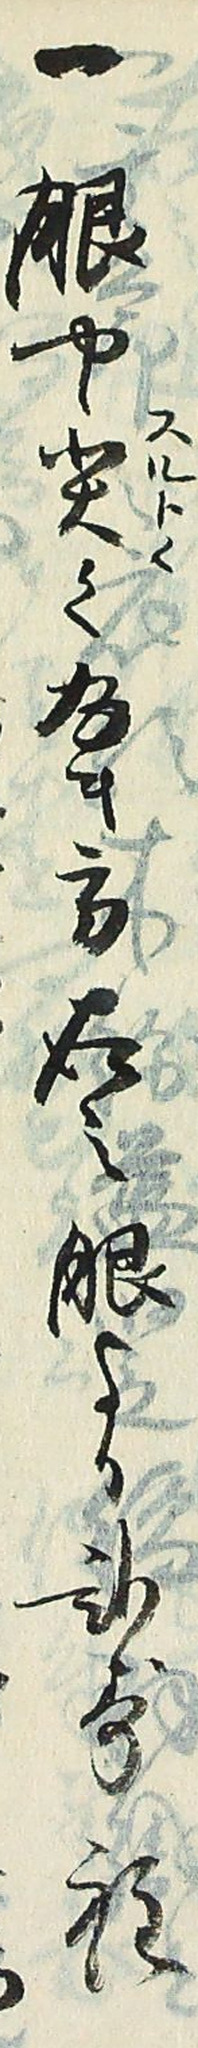一眼やゝ尖く丸き方右之眼より弐歩程
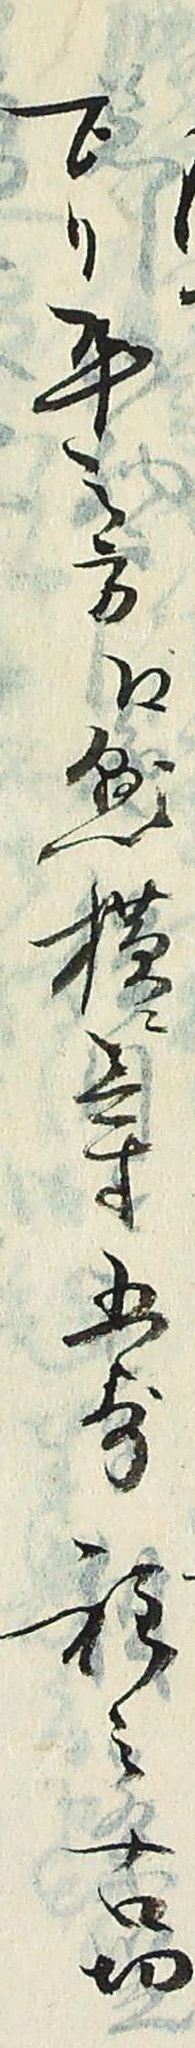下り平之方江懸横に壱寸五歩程之古切
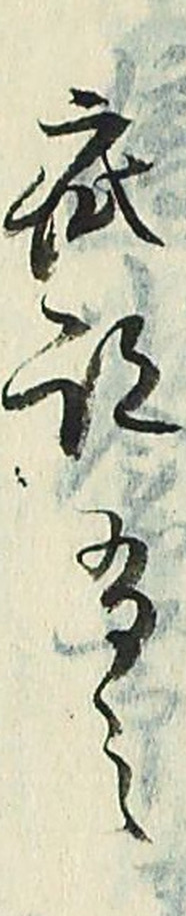疵跡有之
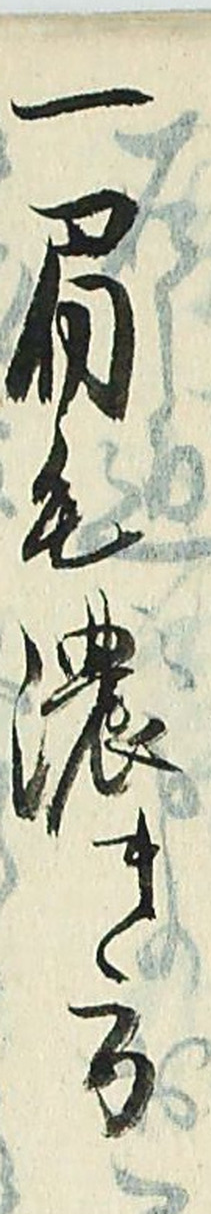一眉毛濃き方
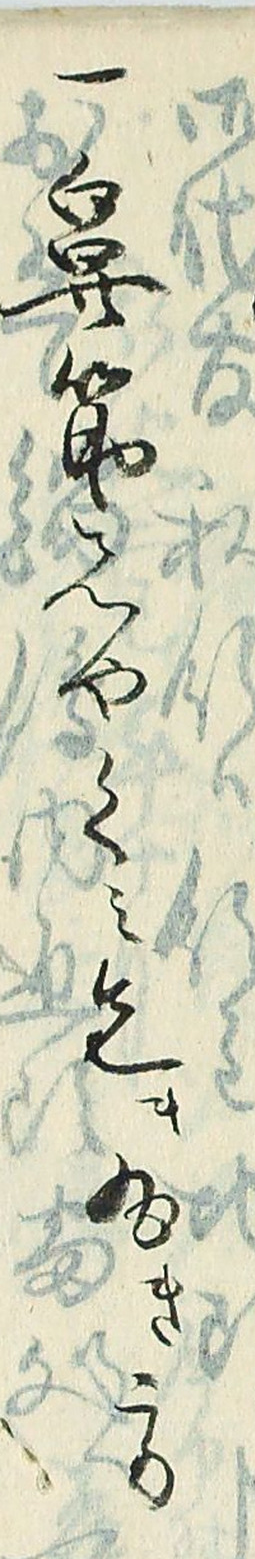一鼻筋しやくみ先き丸き方
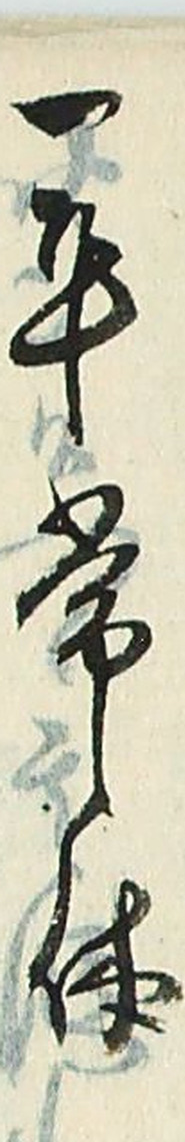一平常体
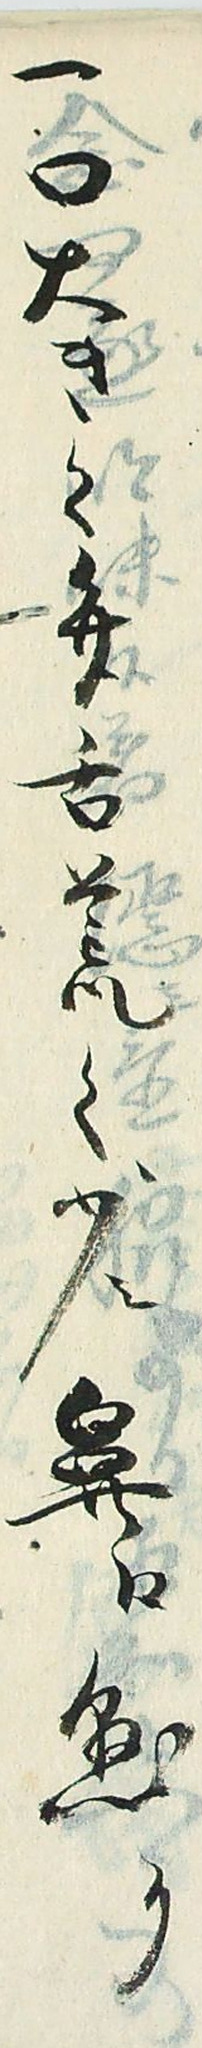一口大きく弁舌荒く少し鼻江懸り

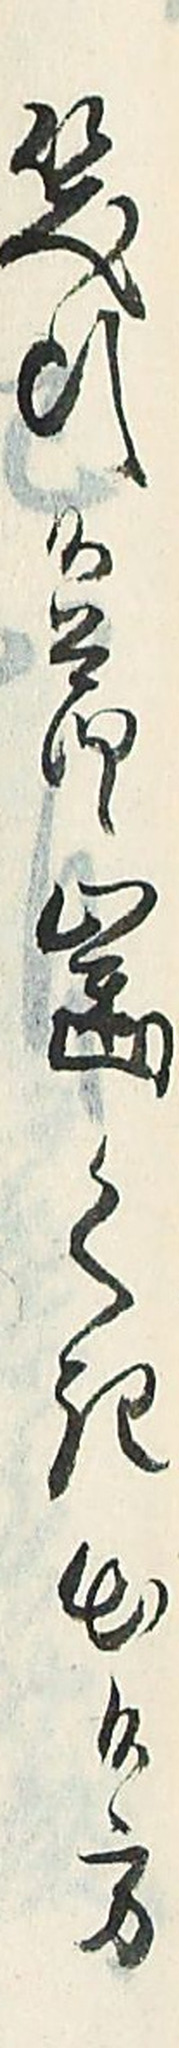笑ひ候節歯くき出候方
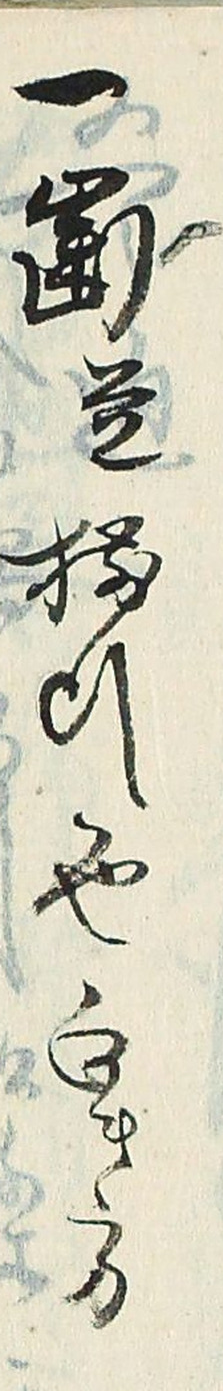一歯並揃ひ色白き方
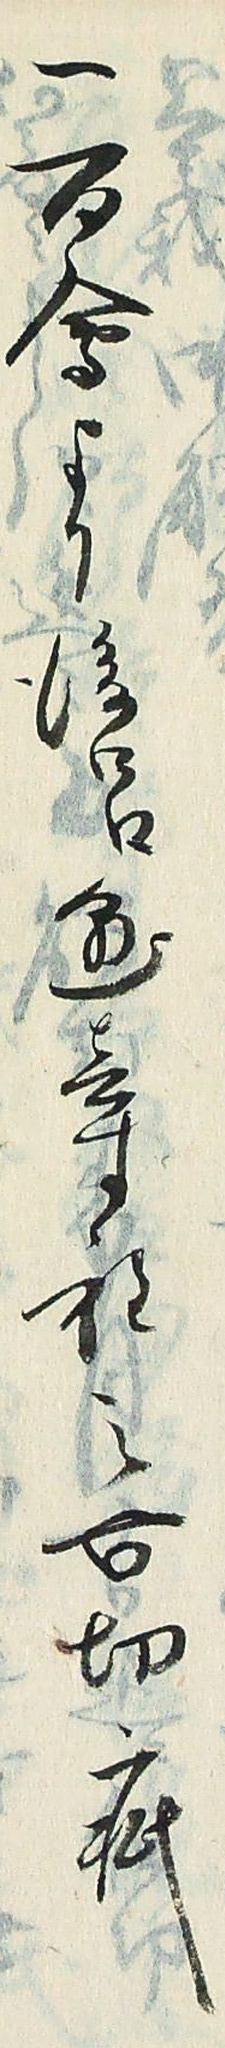一百会より後ろ江懸壱寸程之古切疵
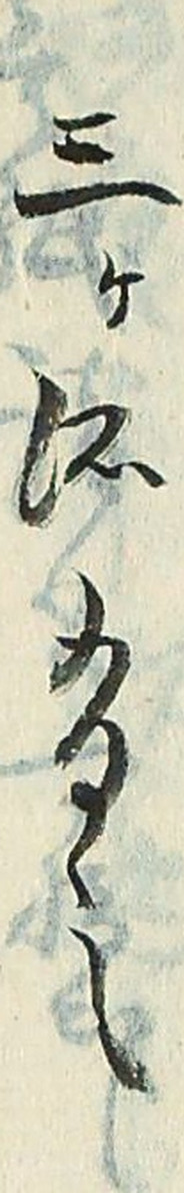三ケ所有之
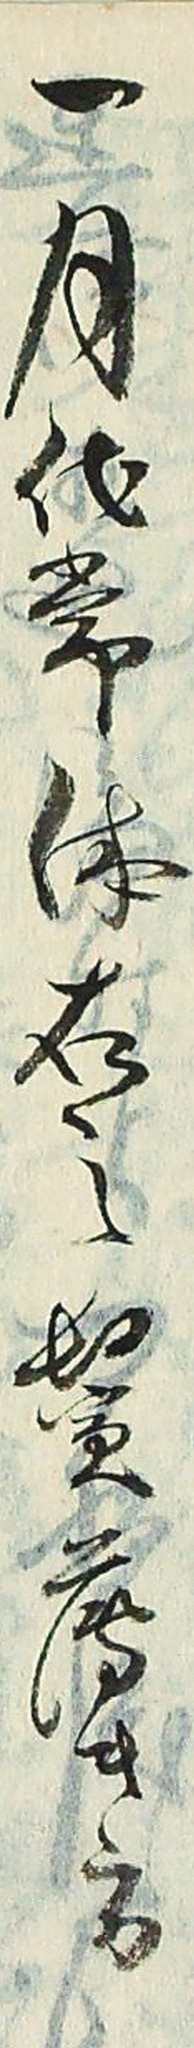一月代常体右之鬢薄き方
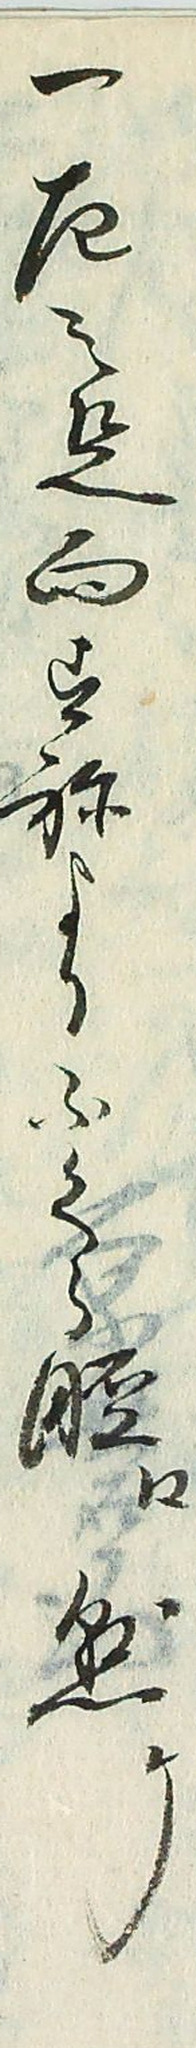一左之足向すねよりふくら脛江懸け
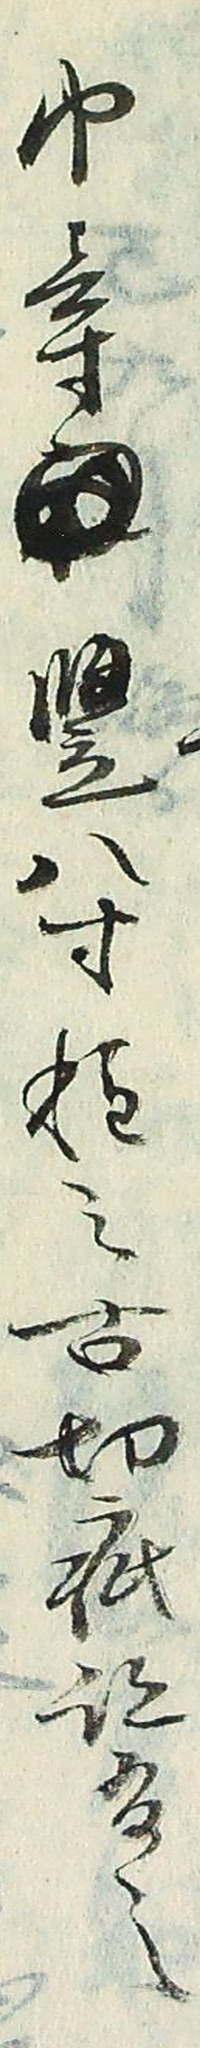巾壱寸竪八寸程之古切疵跡有之
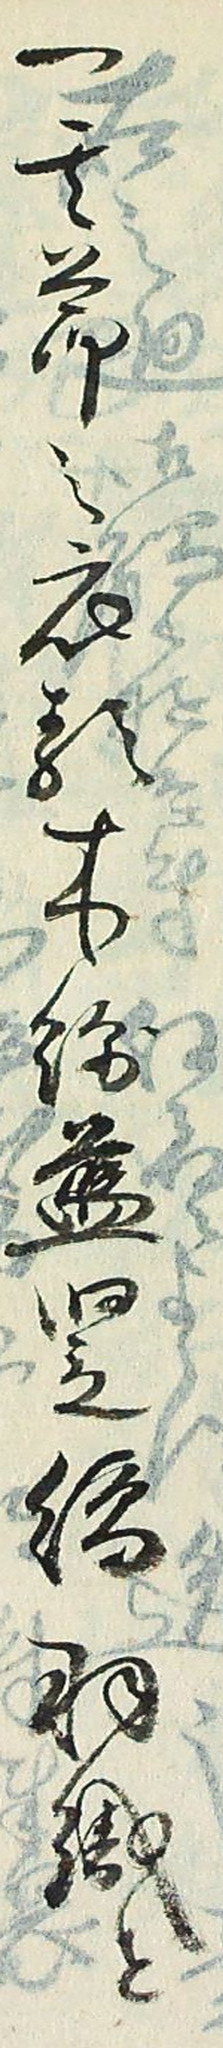一其節之衣類木綿藍竪縞羽織を
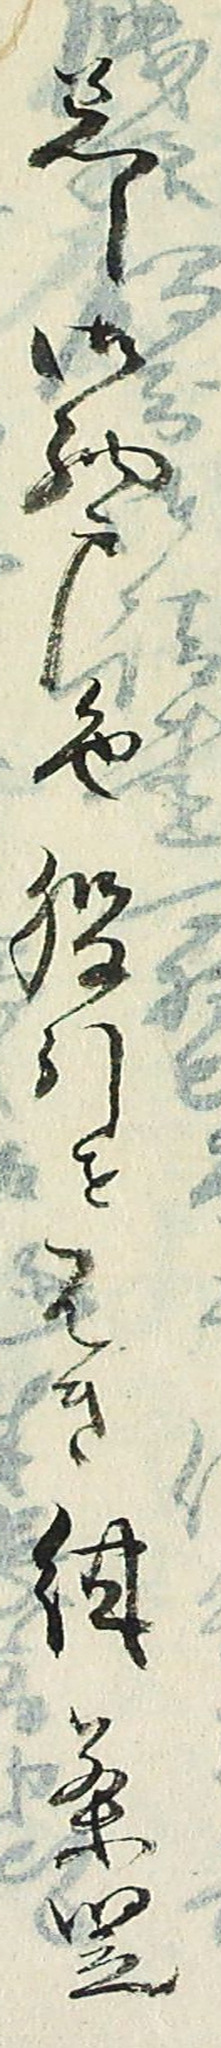着し御納戸色股引をはき紺茶竪
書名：諸御用御□受書控
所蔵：鳴門教育大学 Naruto University of Education
